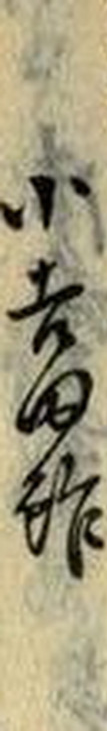小吉田鮓
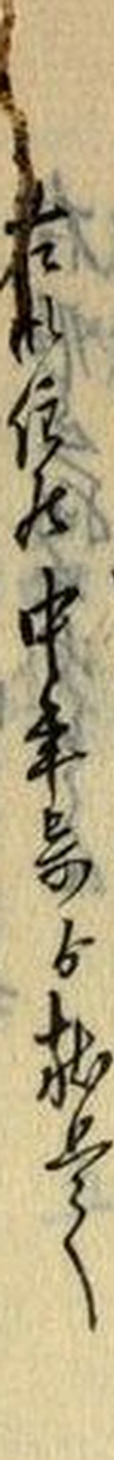右御住居中年寄ゟ献上之
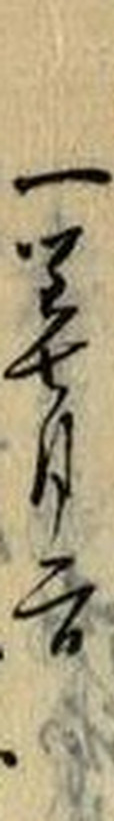一閏七月二日
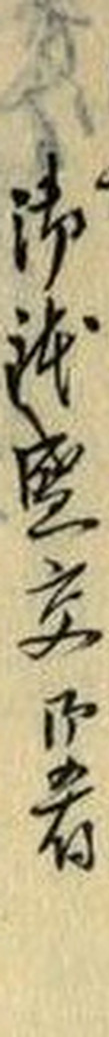御鉢盛交御肴壱台
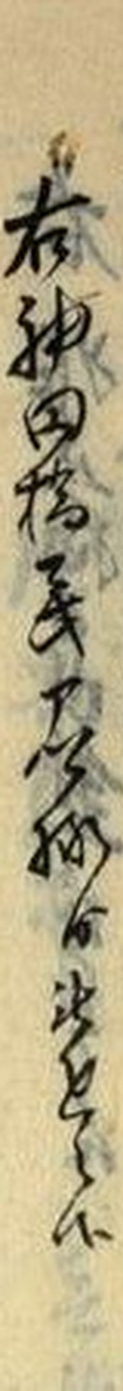右神田橋民部卿様ゟ被進之候
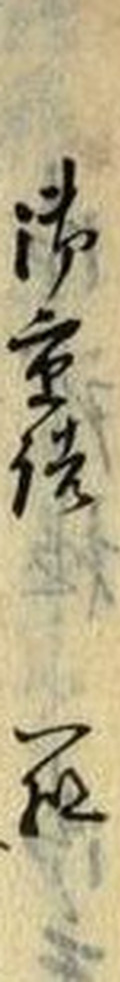御重詰一組
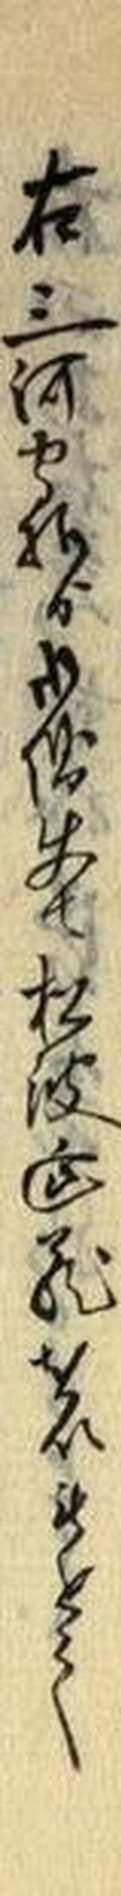右三河守様ゟ御側使者松波延蔵を以被進之
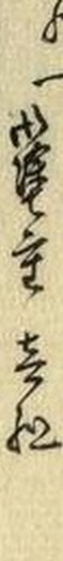御塗重一組
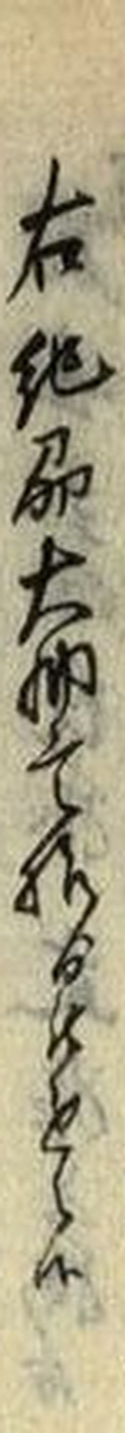右紀州大納言様ゟ被進之候
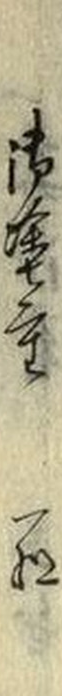御重詰一組
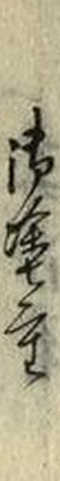御塗重
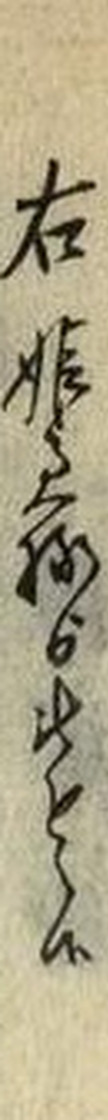右姫君様ゟ被進候
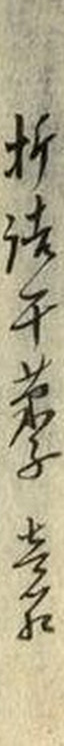折詰干菓子壱箱
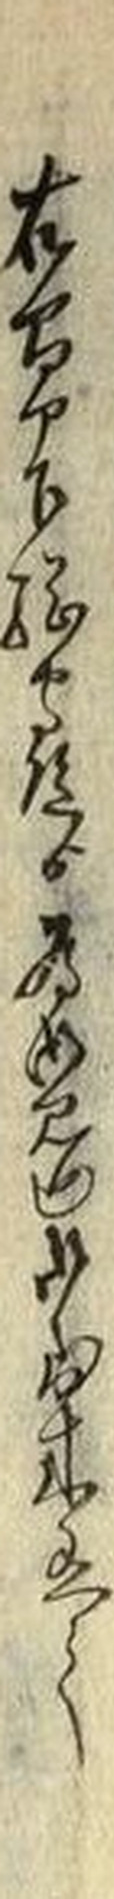右間部下総守殿ゟ為御見廻御到来有之
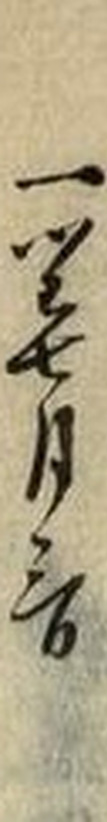一閏七月三日
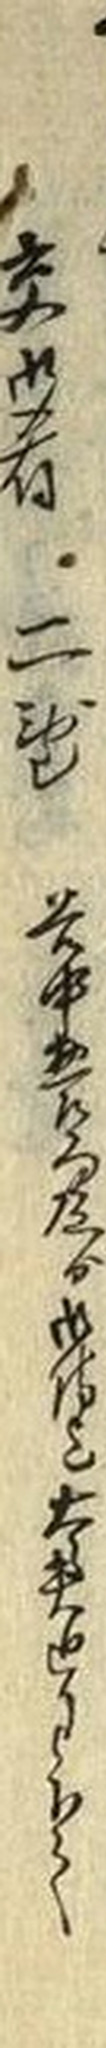交御肴二台谷中惣左衛門殿ゟ御侍迄大奥廻り被下之
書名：少傅日録抄（斉承付側向頭取日記、在府）
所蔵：福井県文書館 Fukui Prefectural Archives
